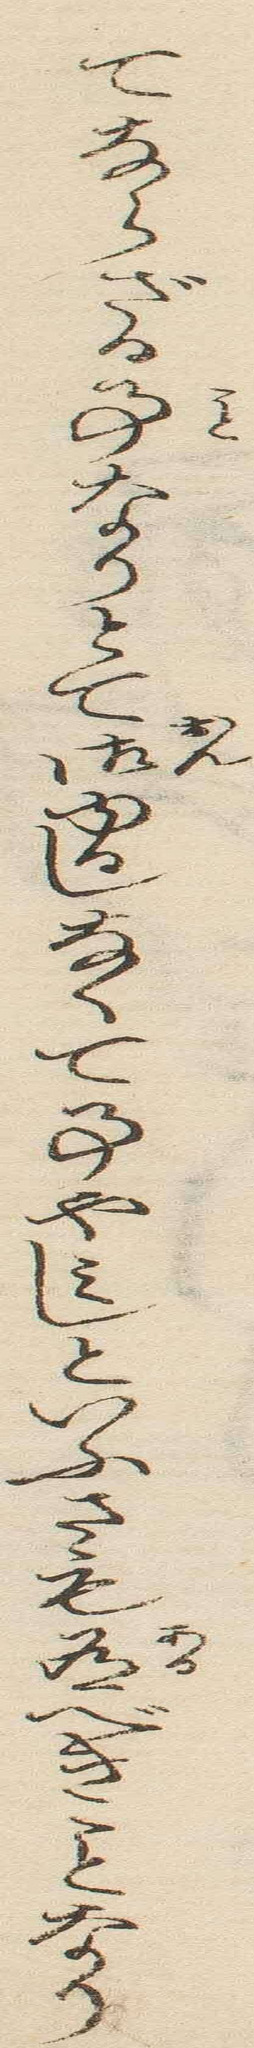てならざる事なりとて御ゆるしなくて事やみしといふさも有べきことなり
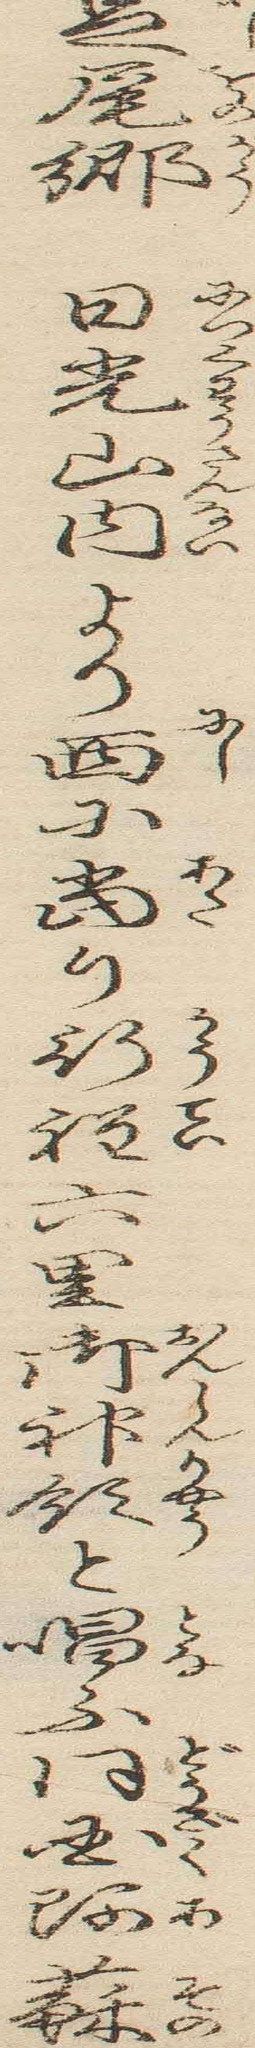足尾郷日光山内より西に當り行程六里御神領と唱ふ同國阿蘇
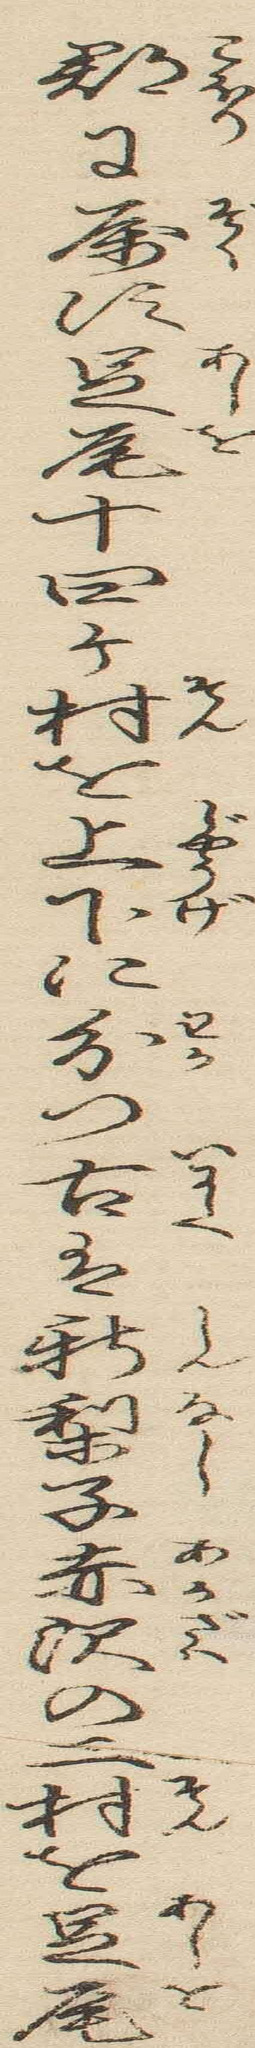郡に属す足尾十四ヶ村を上下に分つ古は新梨子赤沢の二村を足尾

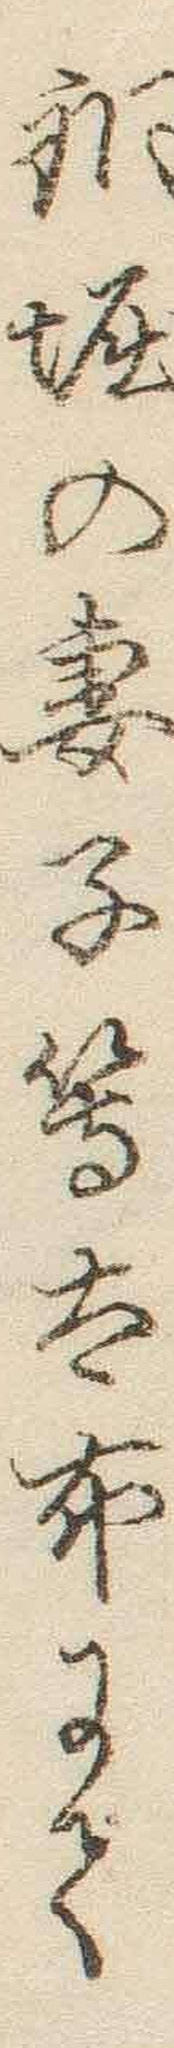銅堀の妻子等太布にて
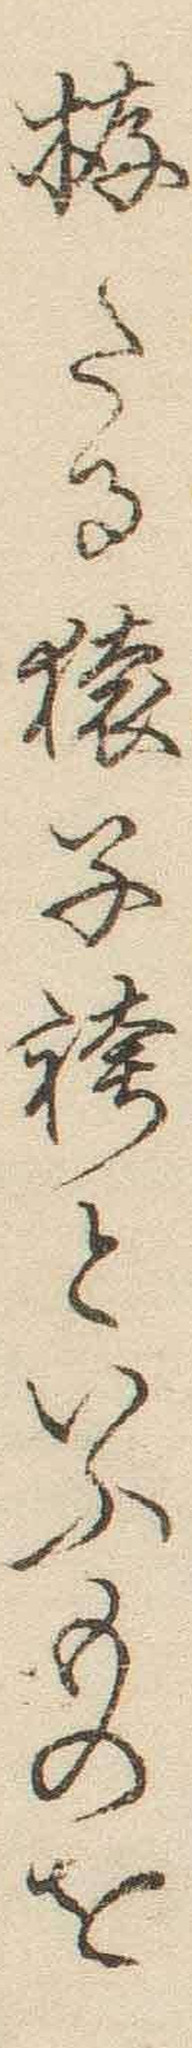拵たる猿子袴といふものを
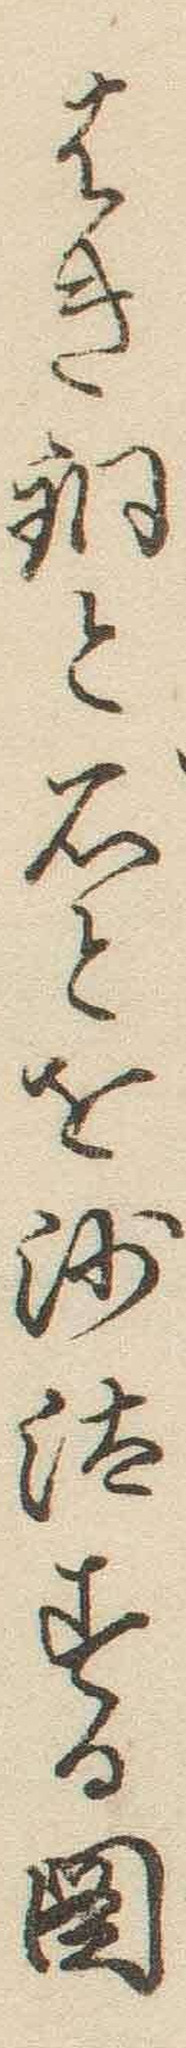はき銅と石とを沙汰する圖

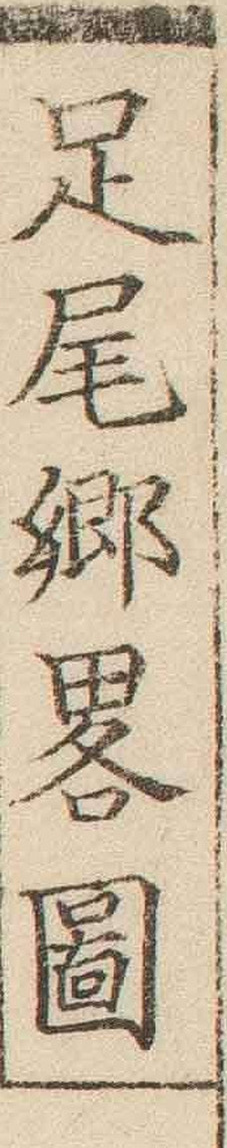足尾郷畧圖

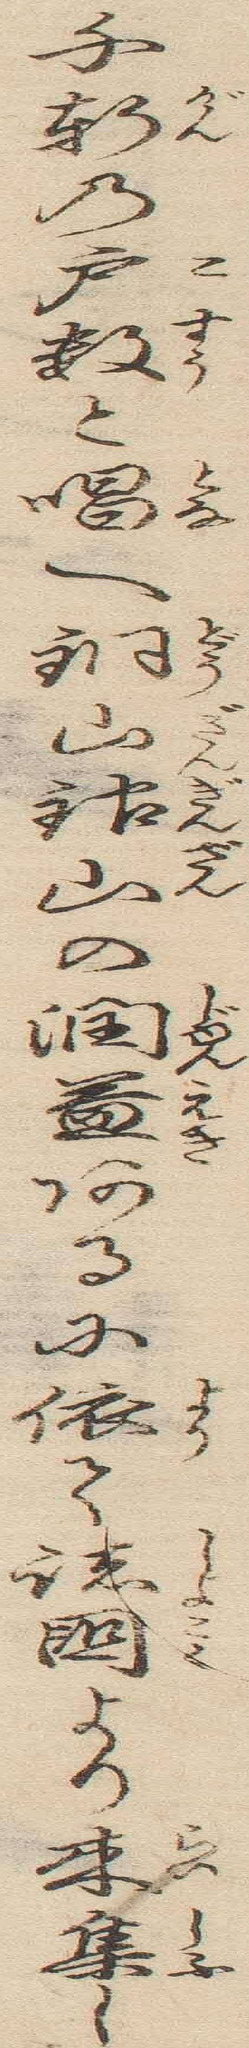千軒の戸数と唱へ銅山銀山の潤益あるに依て諸國より來集し
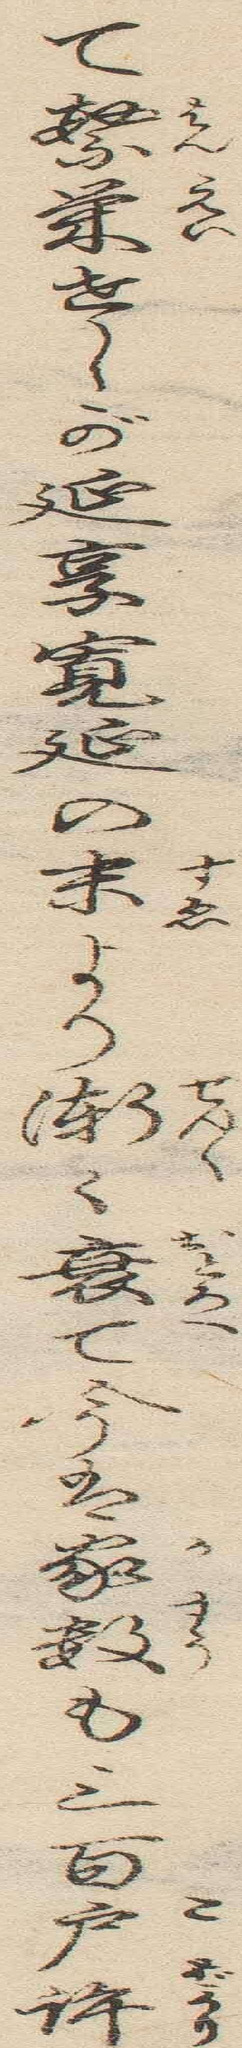て繁栄せしが延享寛延の末より漸〻衰て今は家数も三百戸許
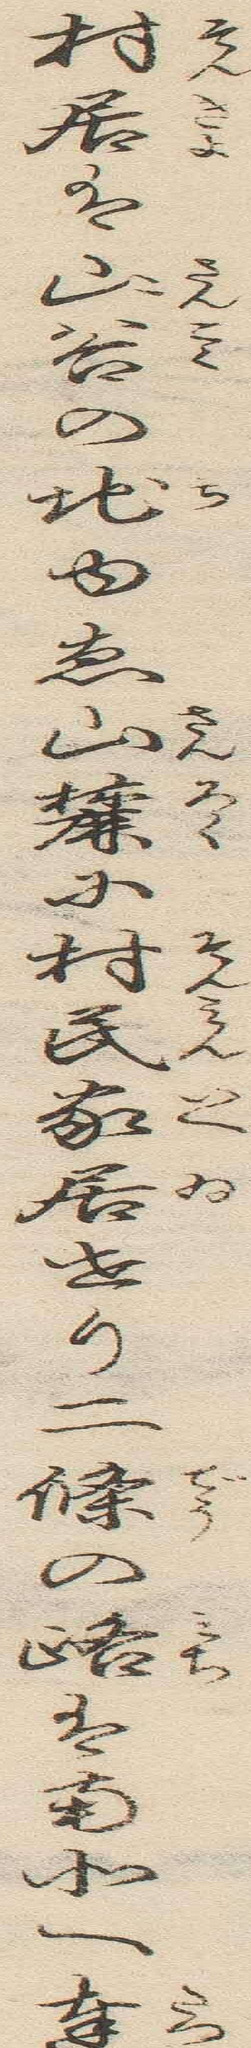村居は山谷の地ゆゑ山麓に村民家居せり二條の路は南北へ達
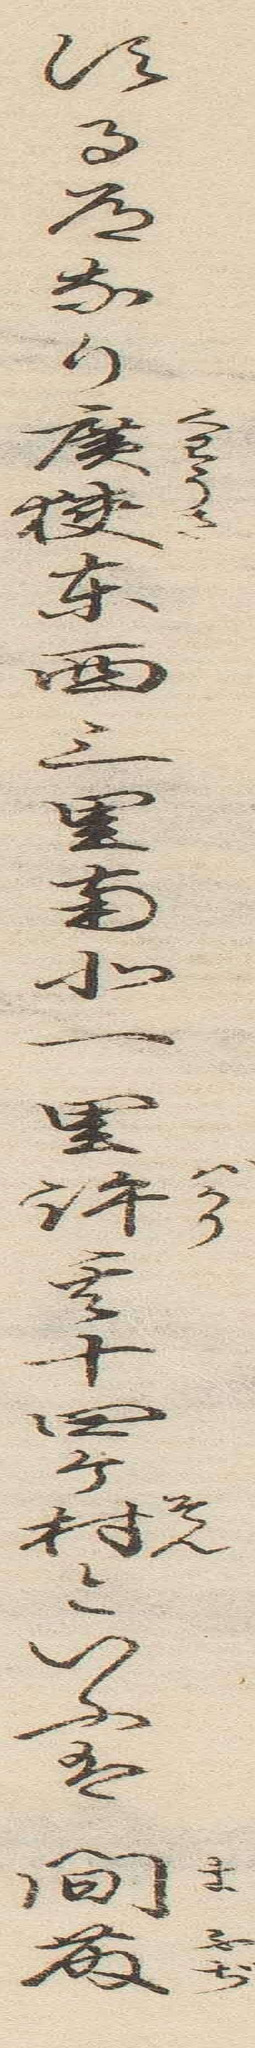する道なり廣狹東西三里南北一里許其十四ヶ村といふは間藤
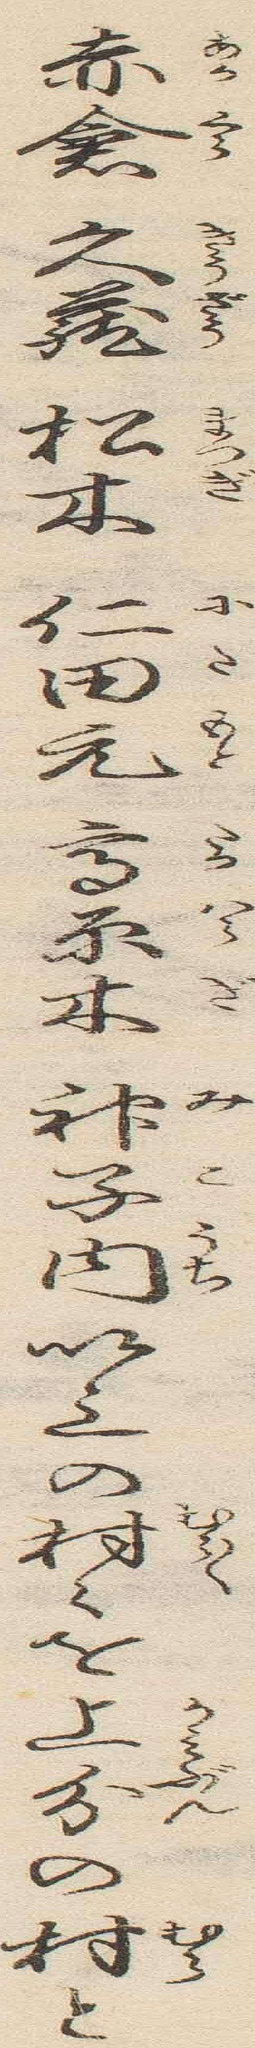赤倉久蔵松木仁田元高原木神子内以上の村〻を上分の村と
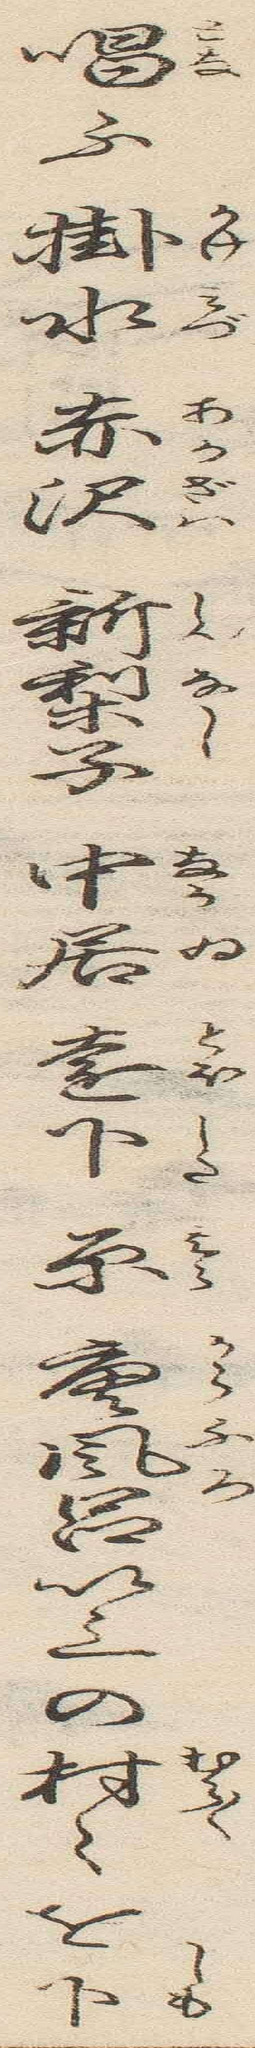唱ふ掛水赤沢新梨子中居遠下原唐風呂以上の村〻を下
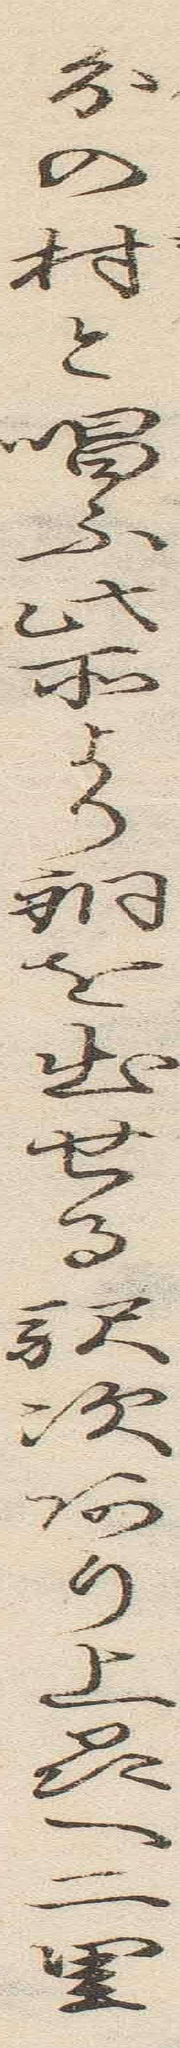分の村と唱ふ此所より銅を出せる駅次あり上刕へ二里
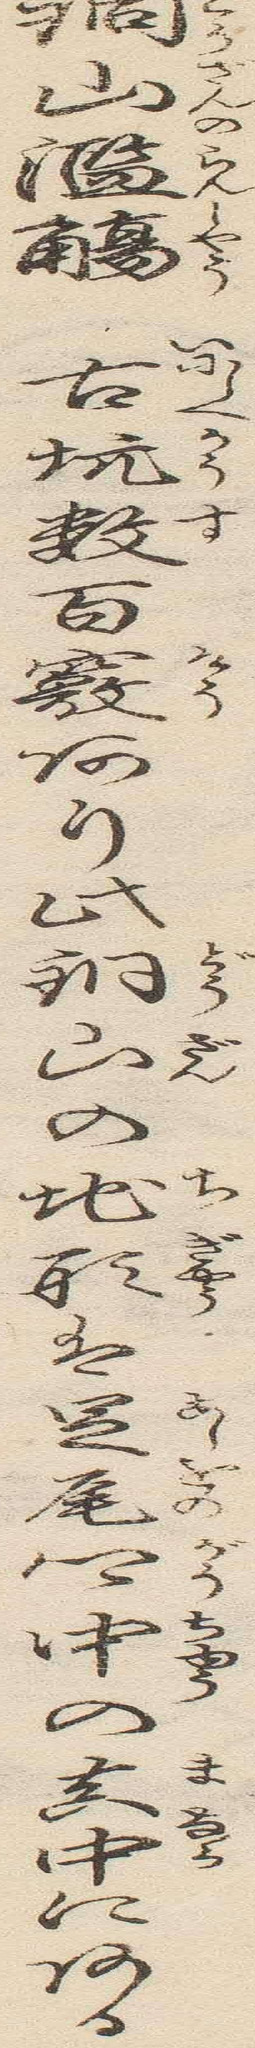銅山濫觴古坑数百竅あり此銅山の地形は足尾郷中の真中にある
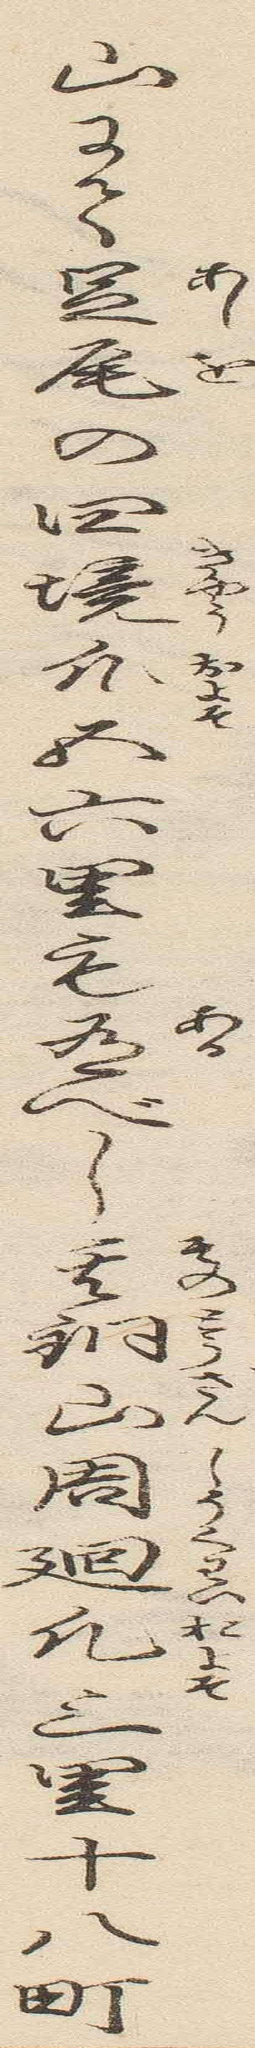山にて足尾の四境凢五六里も有べし其銅山周𢌞凢三里十八町
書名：日光山志
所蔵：東京学芸大学附属図書館 国文学研究資料館
